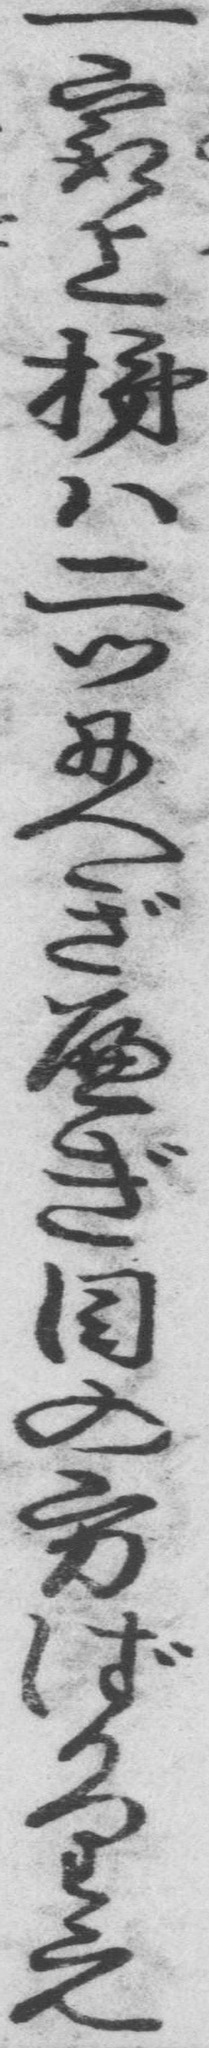一冣上柿は二ツ丹へぎ扁ぎ目の方ばか里之
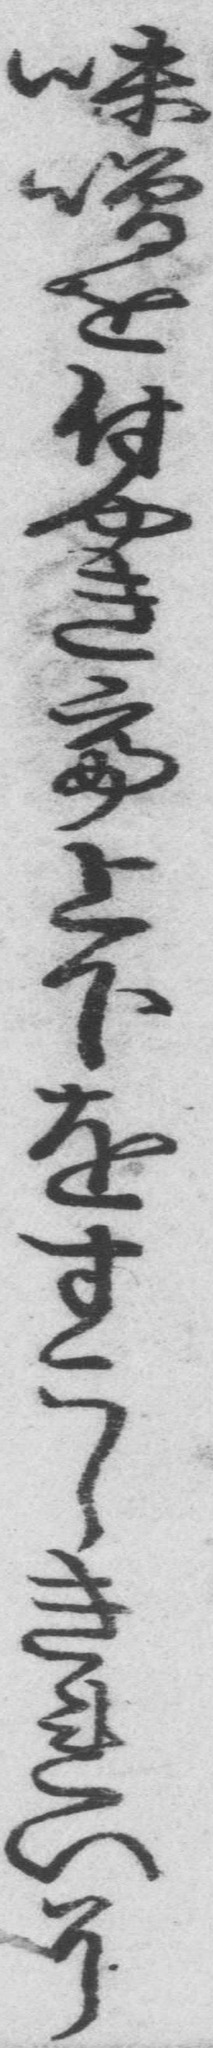味噌を付やき亭上下をすこしき連い耳
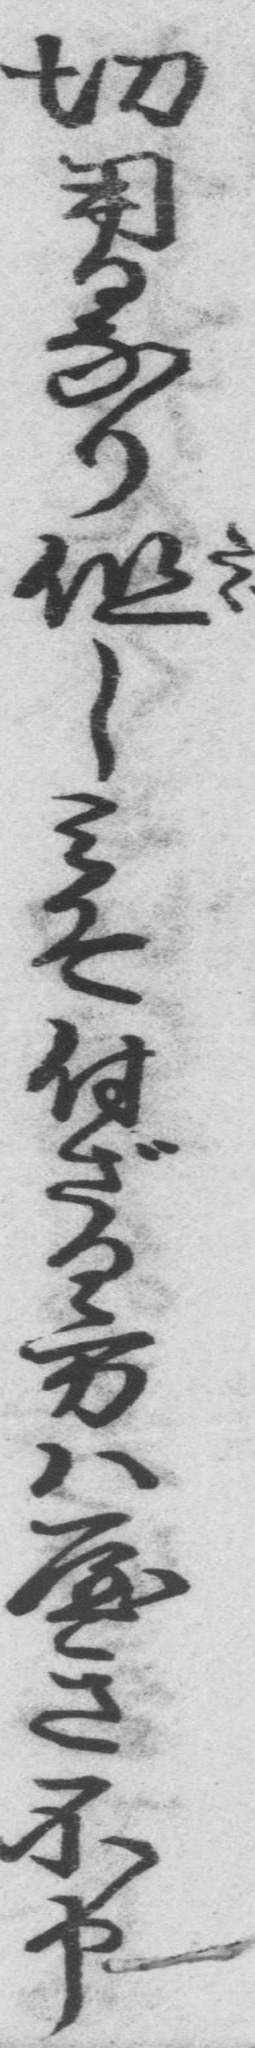切用るなり但しみそ付ざる方は屋き不申
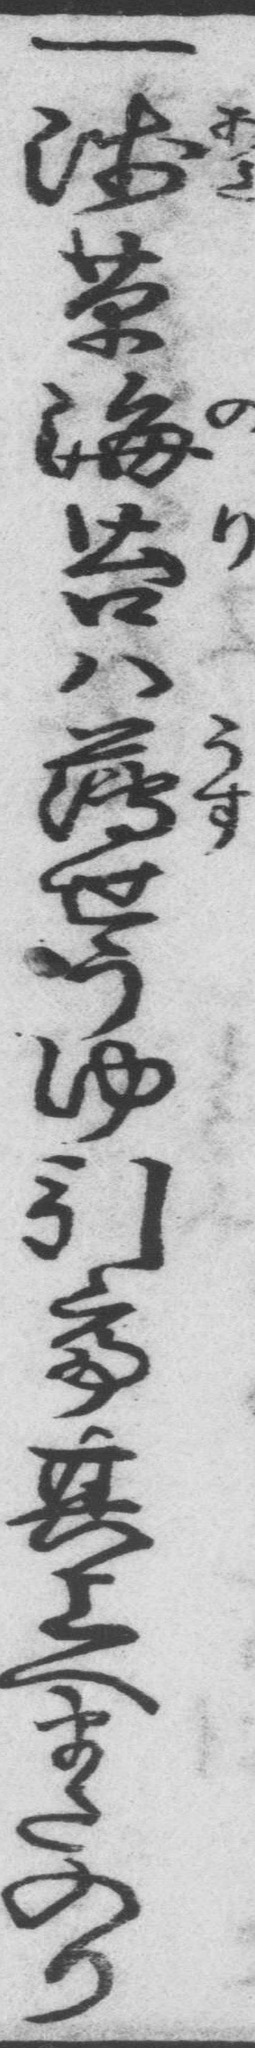一浅草海苔は薄せうゆ引亭其上へまたのり
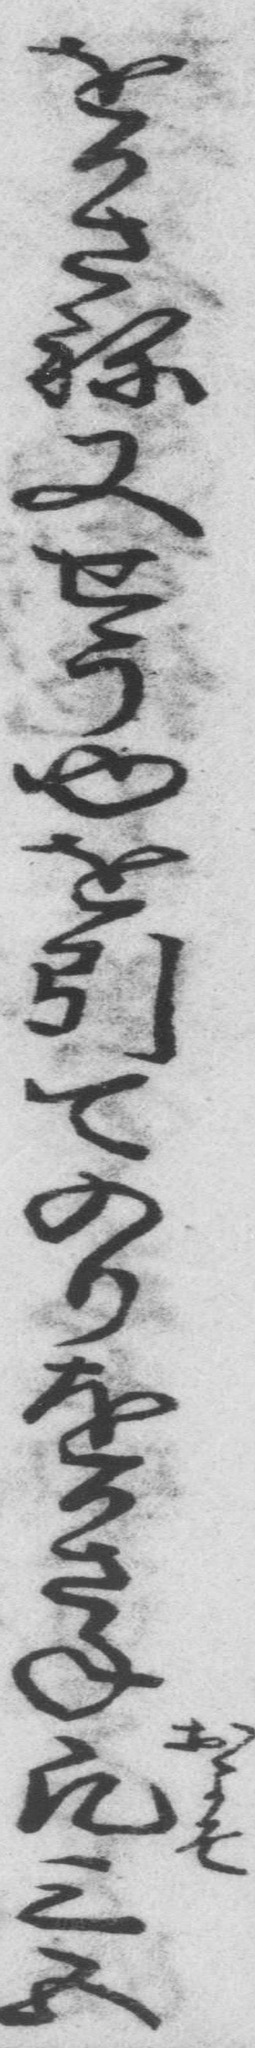をかさ祢又せうゆを引てのりをかさ年凡三五
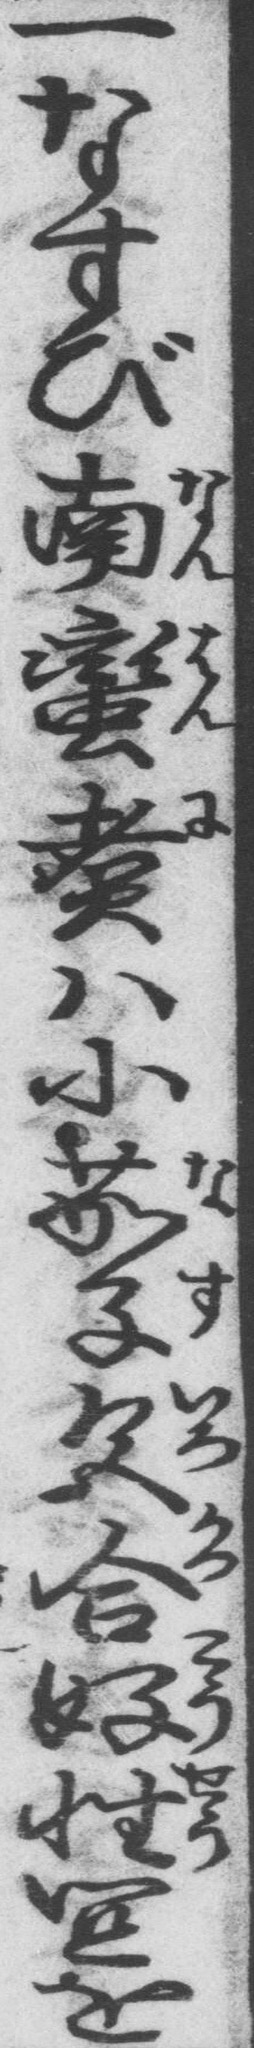一なすび南蛮煮は小茄子色合好性宣を
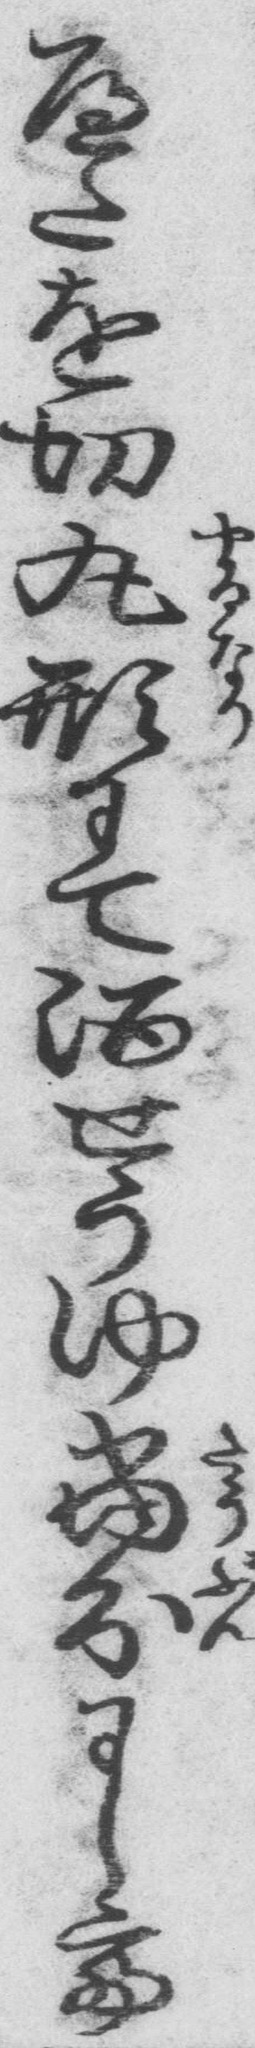扁たを切丸形尓て酒せうゆ当分尓し亭
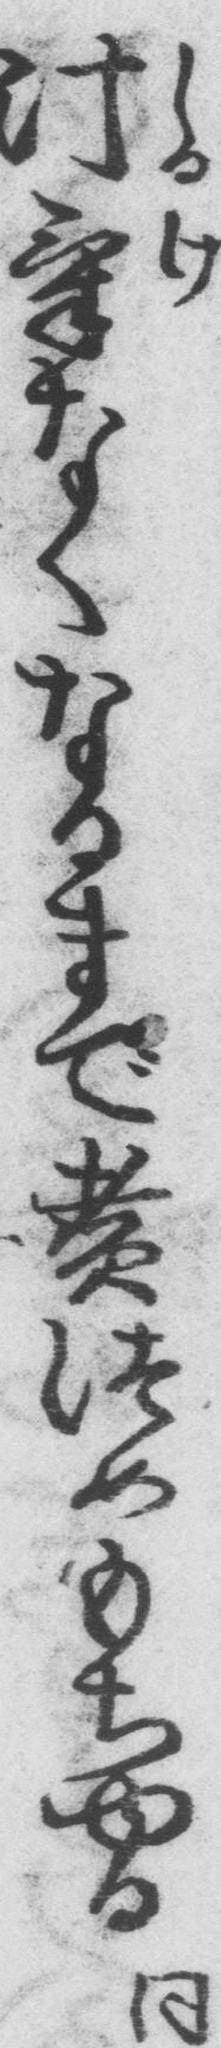汁気なくなるまで煮徒めもちゆる同
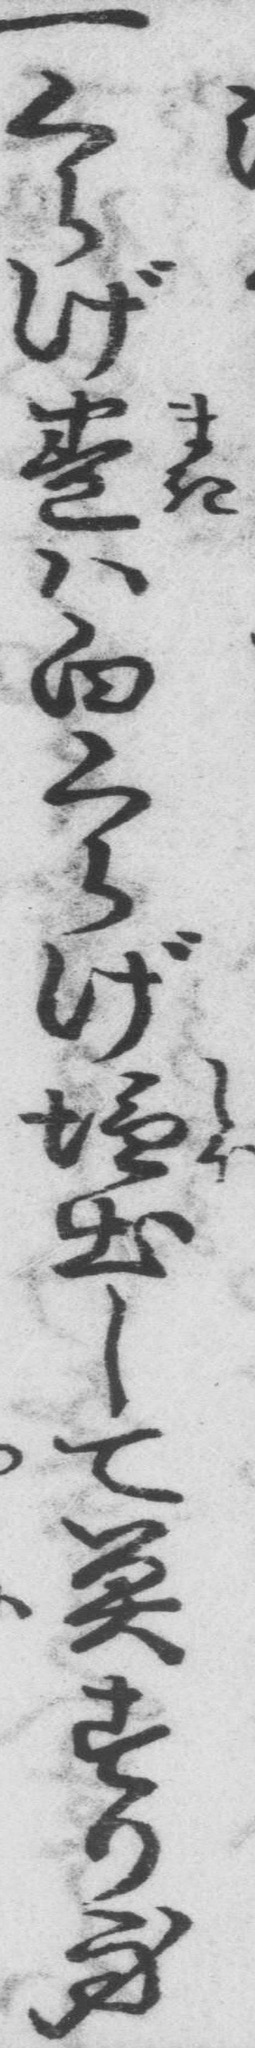一くらげ巻は白くらげ塩出して魚春り身
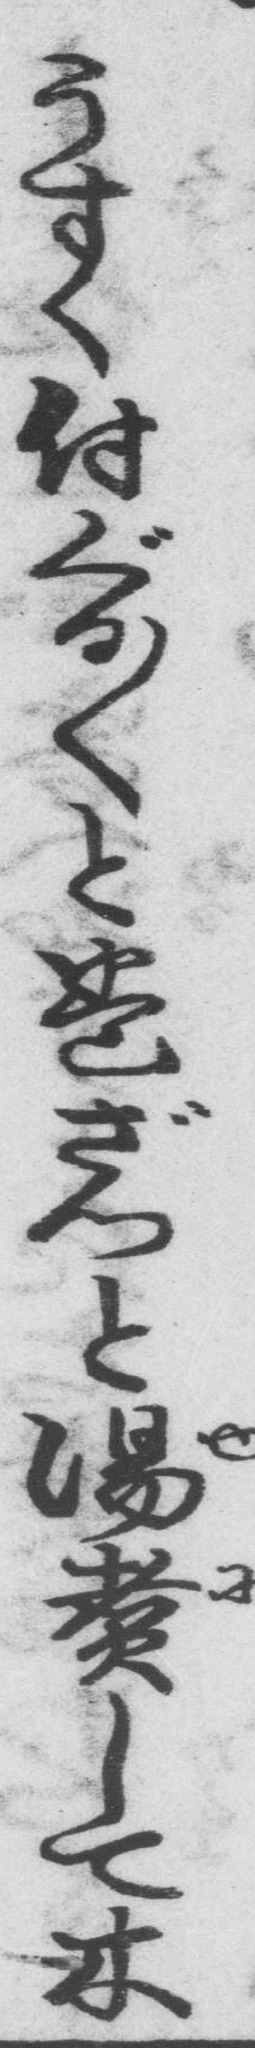うすく付ぐる〳〵と巻ざつと湯煮して木
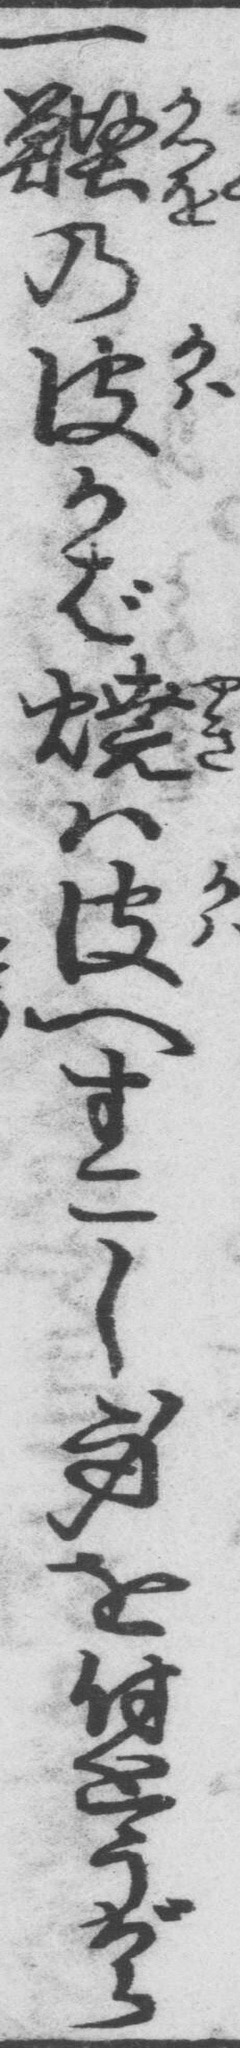一鰹乃皮かば焼は皮へすこし身を付とうがら
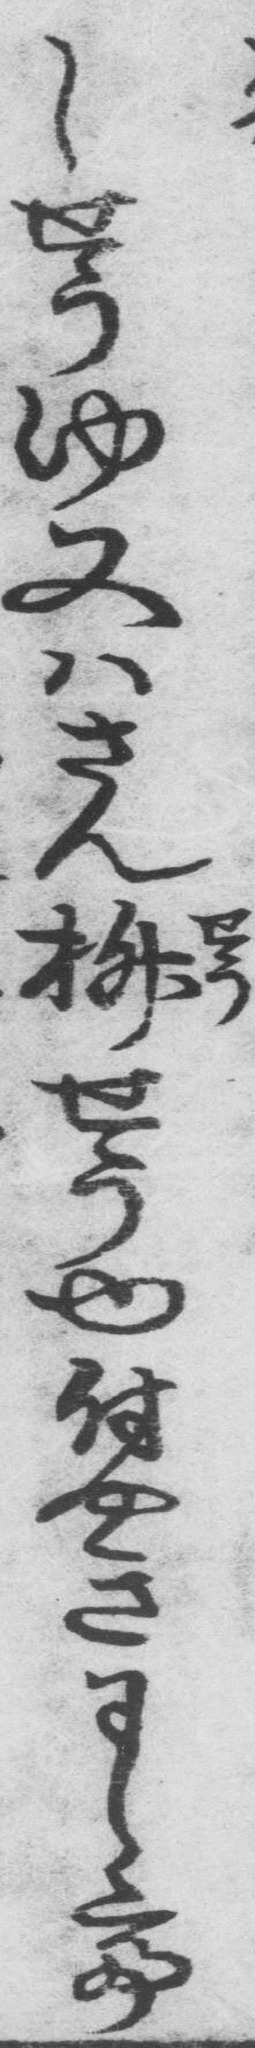しせうゆ又はさん椒せうゆ付やき尓し亭
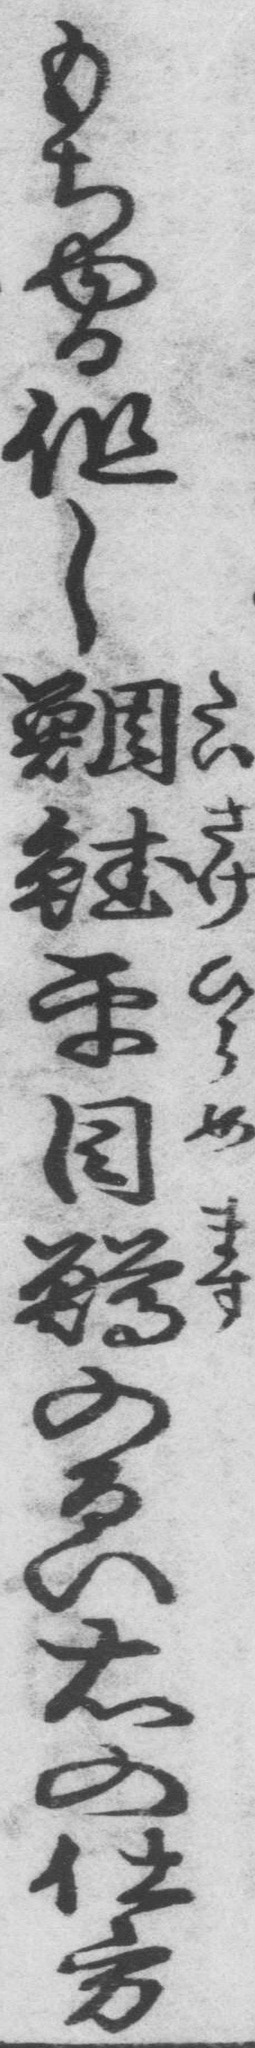もちゆる但し鯛鮭平目鱒のるい右の仕方

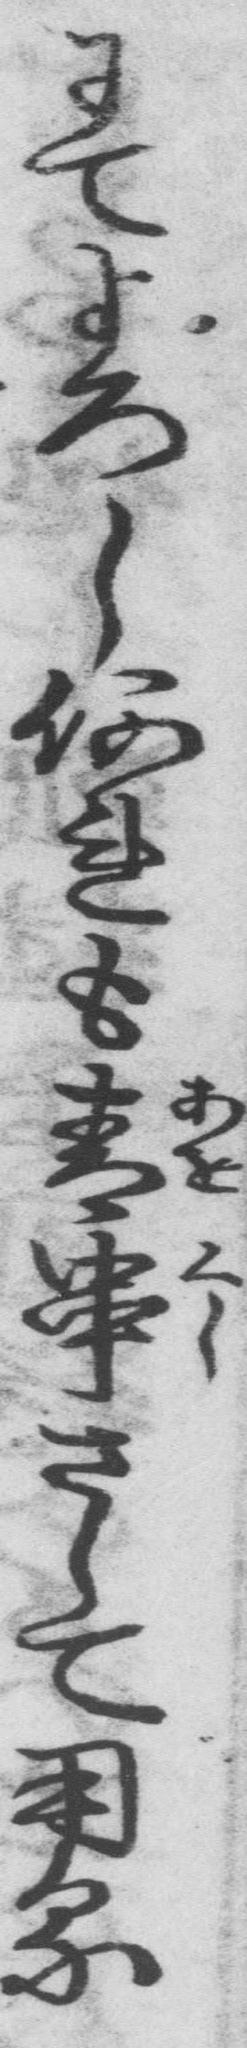尓てよろし何連も青串さして用累
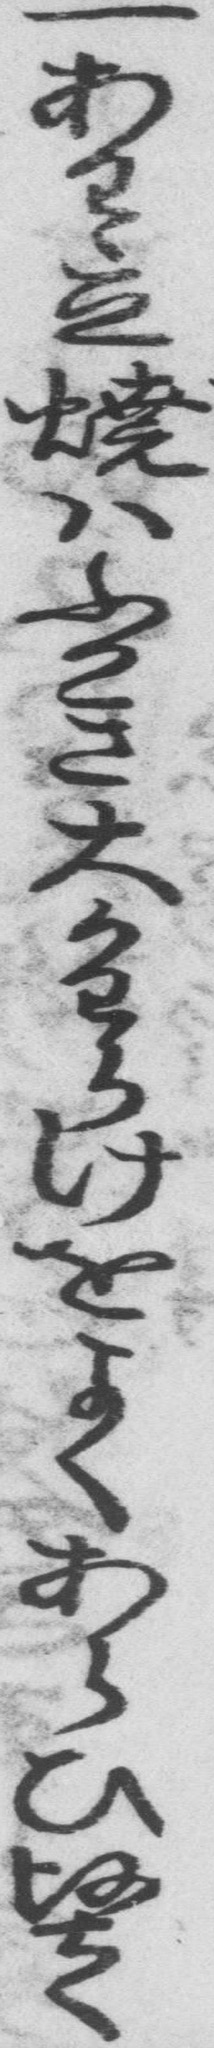一あわ立焼はふかき大かわらけをよくあらひ堅く
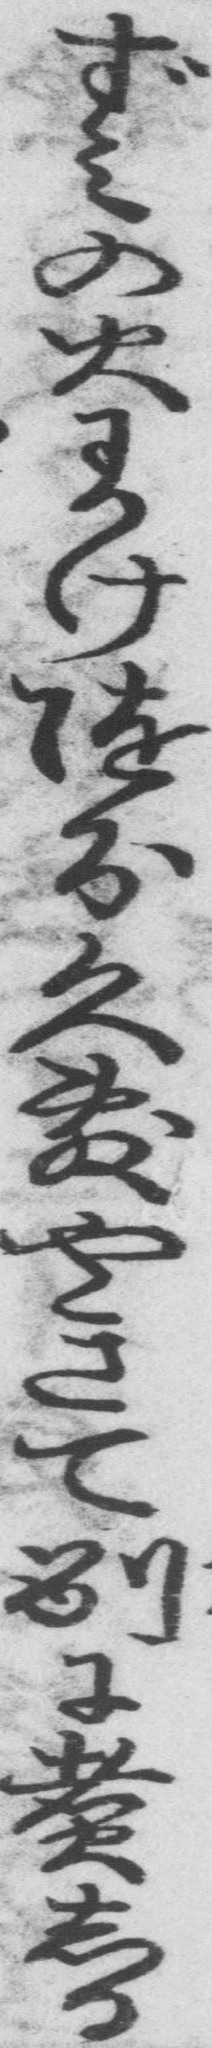ずみの火尓かけ随分久敷やきて別尓煮志る
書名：料理伊呂波庖丁
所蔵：大阪府立大学学術情報センター 国文学研究資料館
